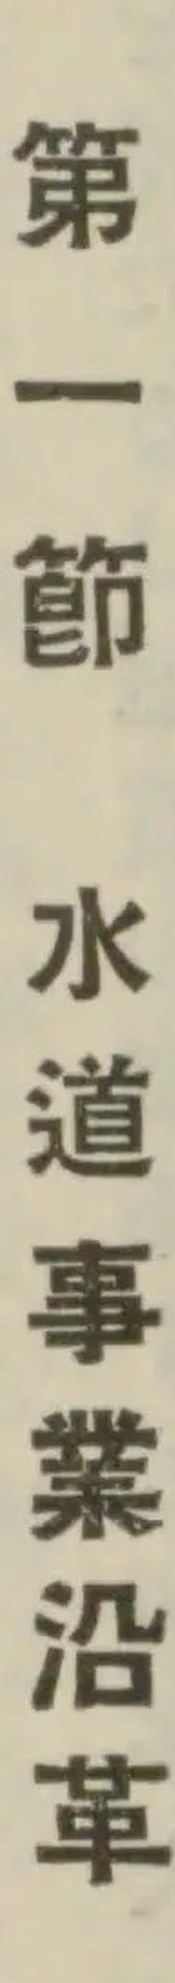第一節水道事業沿革
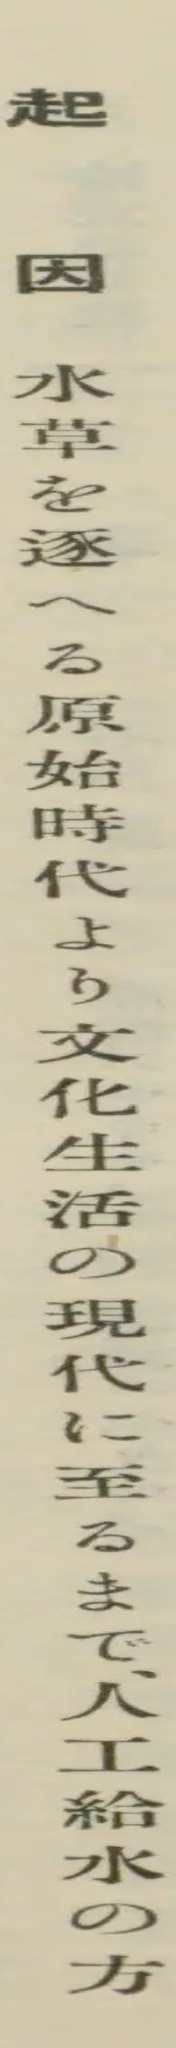起因水草を築逐へる原始時代より文化生活の現代に至るまで、人工給水の方
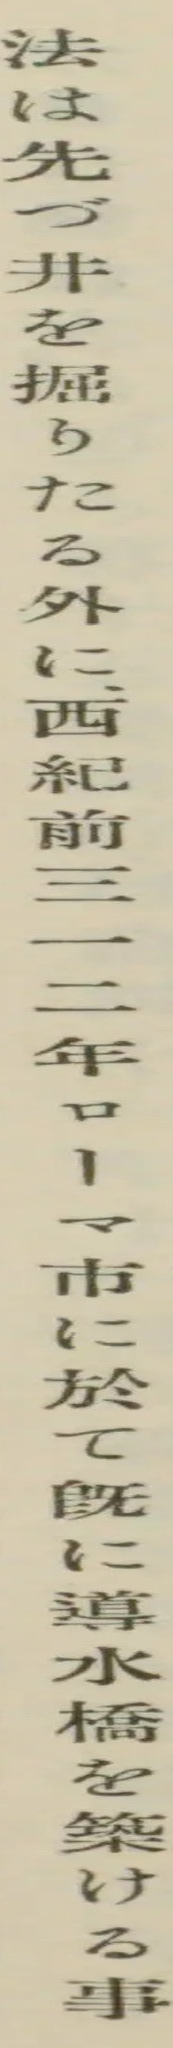法は先づ井を掘りたる外に、西紀前三一二年ローマ市に於て既に導水橋を築ける事
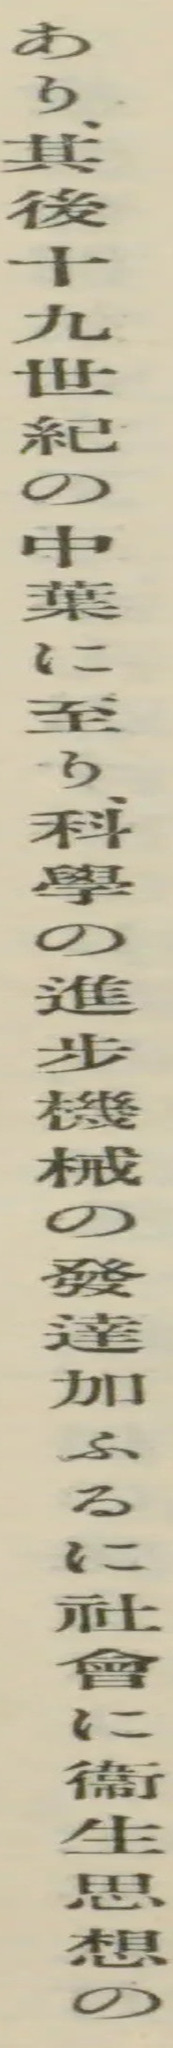あり、其後十九世紀の中葉に至り、科学の進歩機械の発達加ふるに社会の衛生思想の
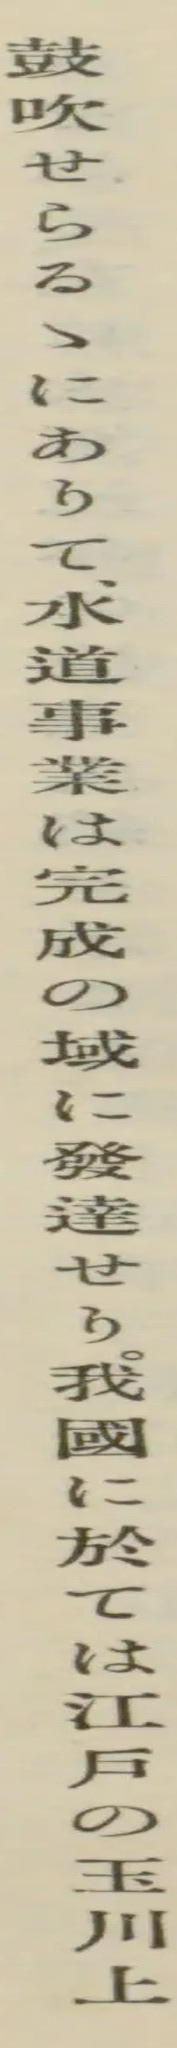鼓吹せらるゝにありて、水道事業は完成の域には発達せり。我国に於ては江戸の玉川上
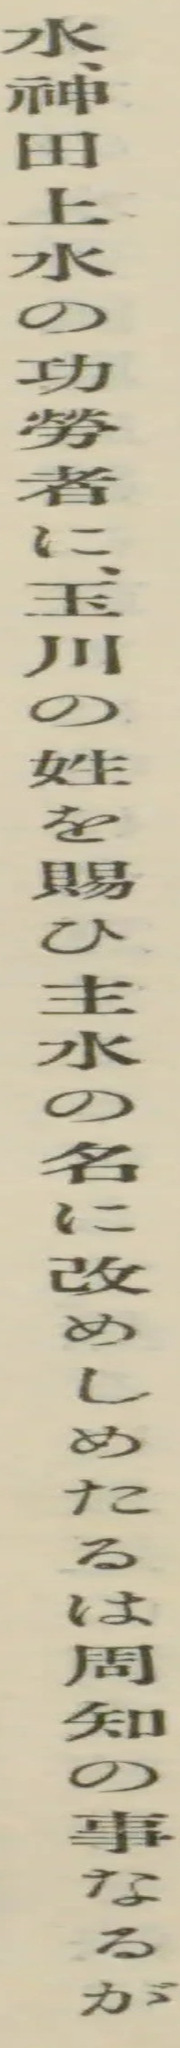水、神田上水の功労者に、玉川の姓を賜ひ主水の名に改めしめたるは周知の事なるが
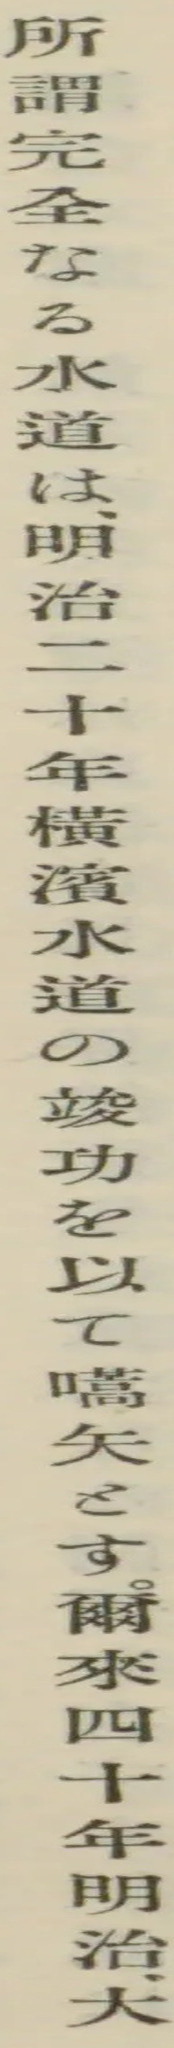所謂完全なる水道は、明治二十年横浜水道の竣工を以て嚆矢とす。爾来四十年明治、大
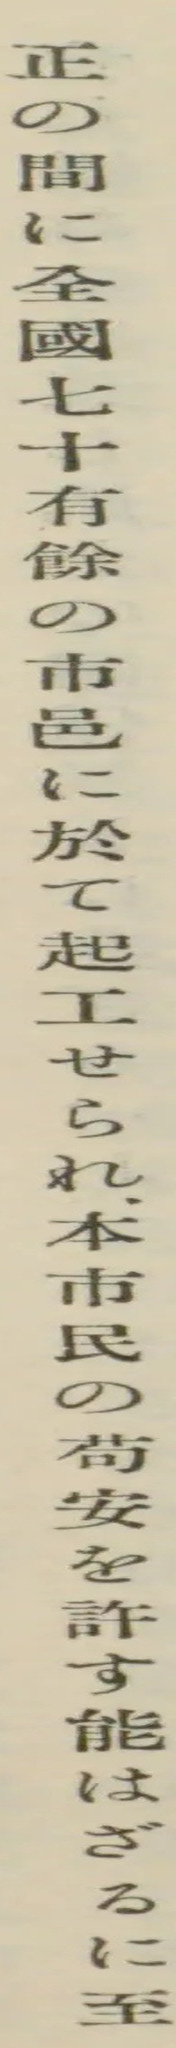正の間に全国七十有余の市邑に於て起工せられ、本市民の苟安を許す能はざるに至
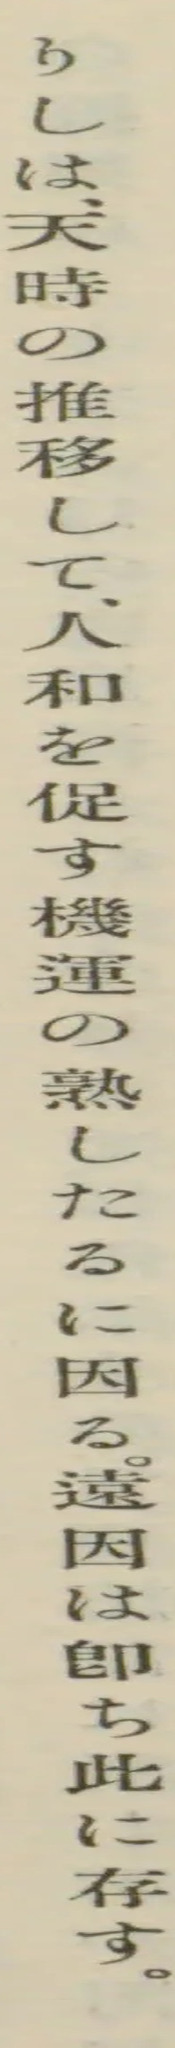りしは、天時の推移して、人和を促す機運の熟したるに因る。遠因は即ち此に存す。
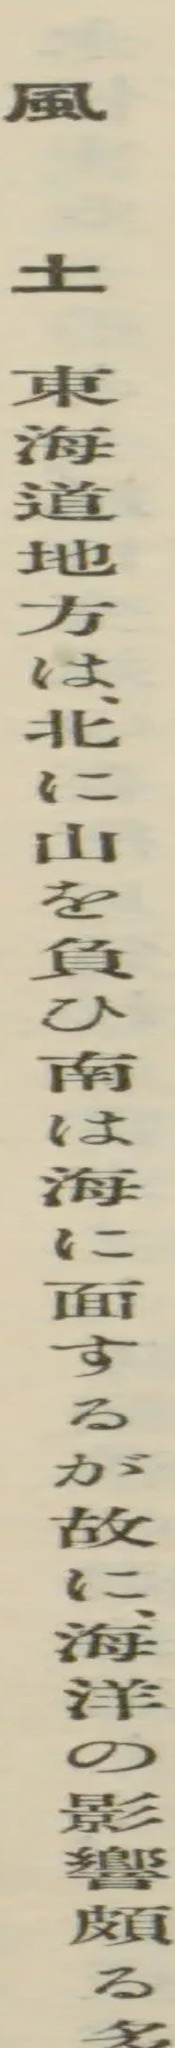風土東海道地方は、北に山を負ひ南は海に面するが故に、海洋の影響頗る多
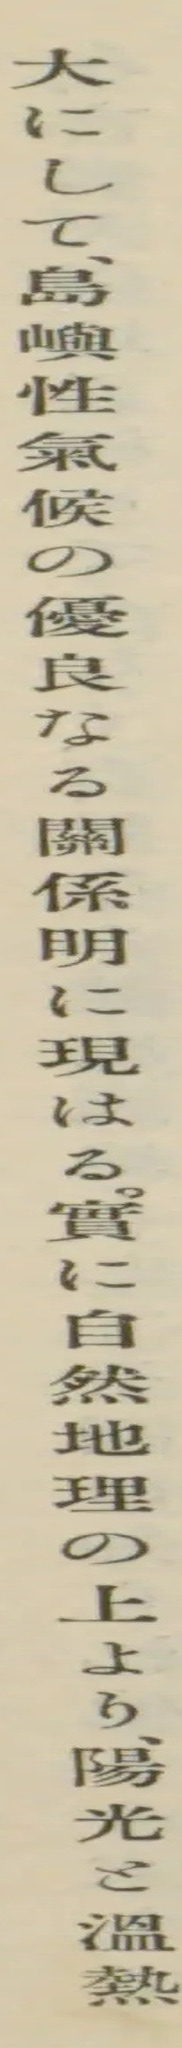大にして、島嶼性気候の優良なる関係明に現はる。実に自然地理の上より、陽光と温熱
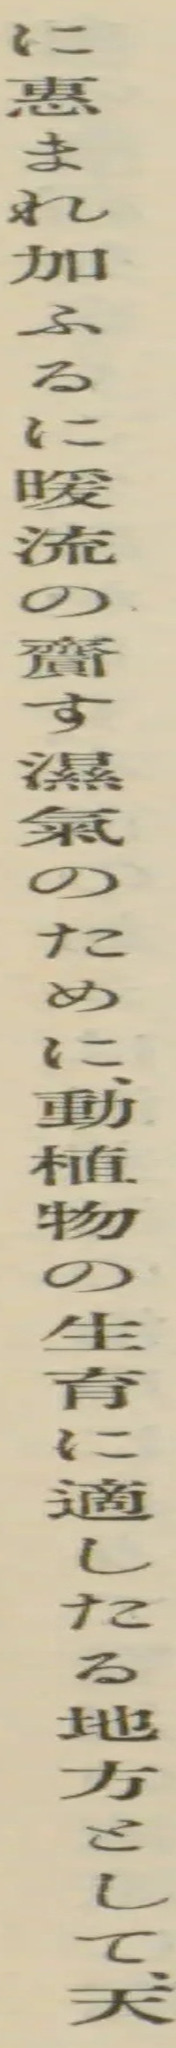に恵まれ加ふるに暖流の齎す濕気のために、動植物の生育に適したる地方として、天

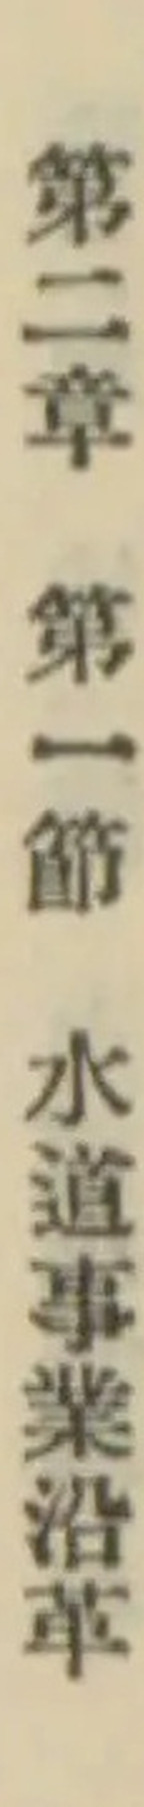第二章第一節水道事業沿革二四
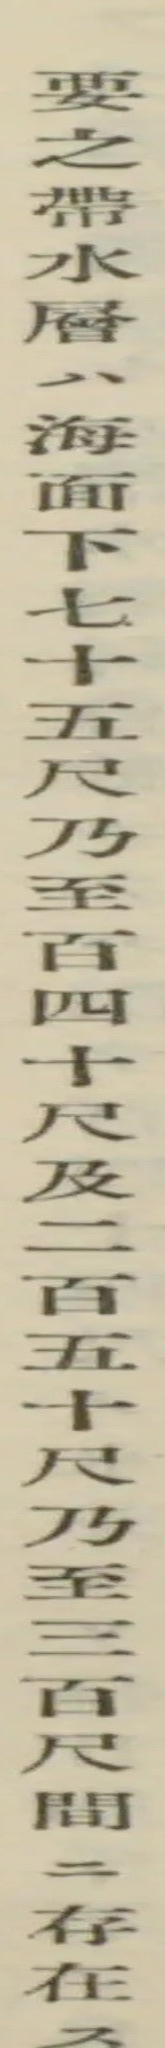要之帯水層は海面下七十五尺乃至百四十尺及二百五十しゃ尺乃至三百尺間に存在す
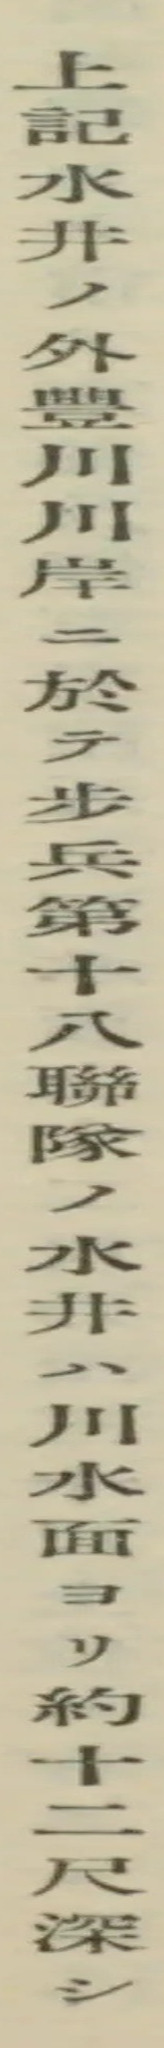上記水井の外豊川川岸に於て歩兵第十八連隊の水井は川水面より約十二尺深し
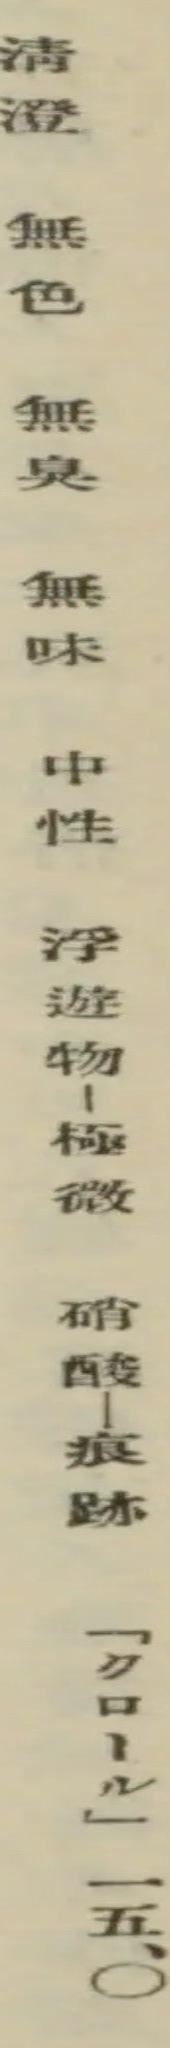清澄無色無臭無味中性浮遊物－極微硝酸ー痕跡「クロール」一五、〇
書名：豊橋市水道誌
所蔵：国立国会図書館 National Diet Library, JAPAN
